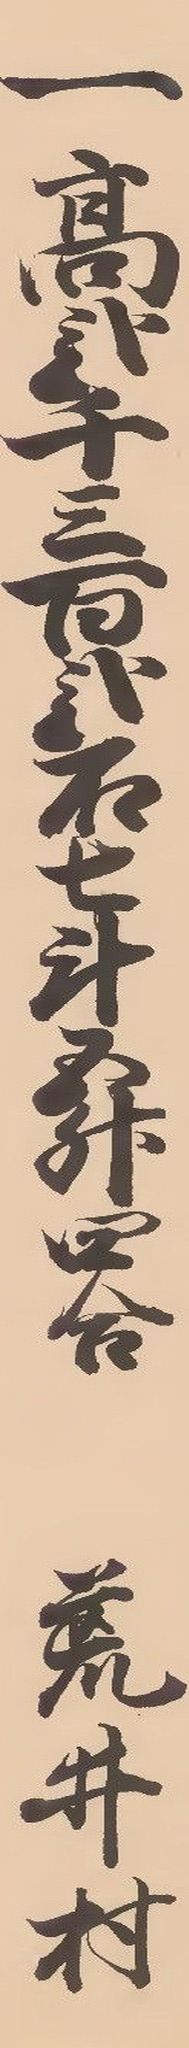一高弐千三百弐石七斗五升四合荒井村
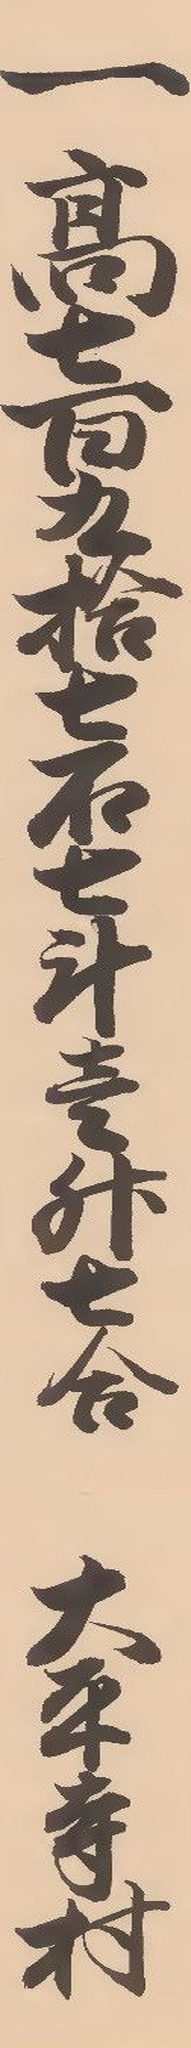一高七百九拾七石七斗壱升七合太平寺村
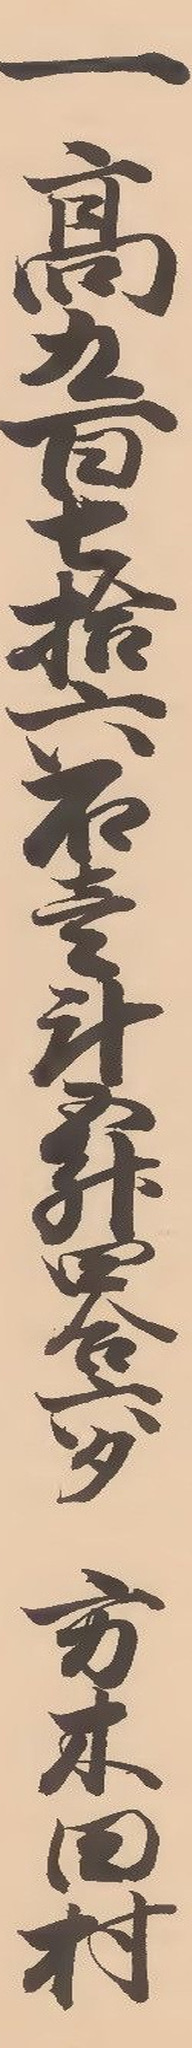一高九百七拾六石壱斗五升四合六勺方木田村
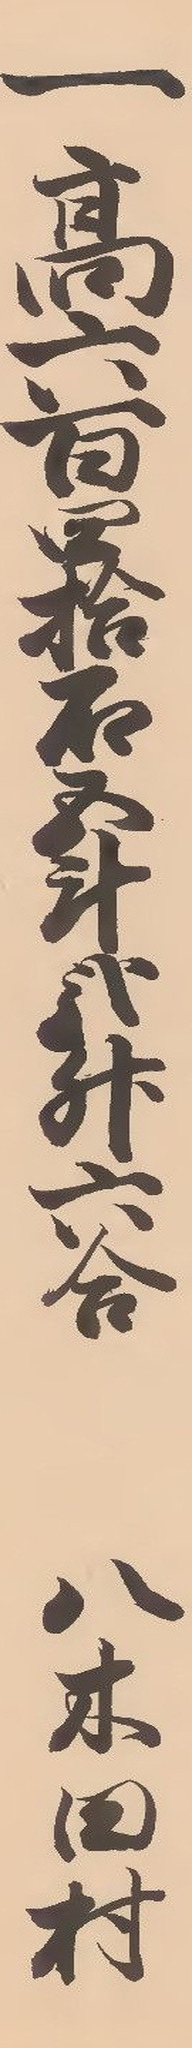一高六百四拾石五斗弐升六合八木田村

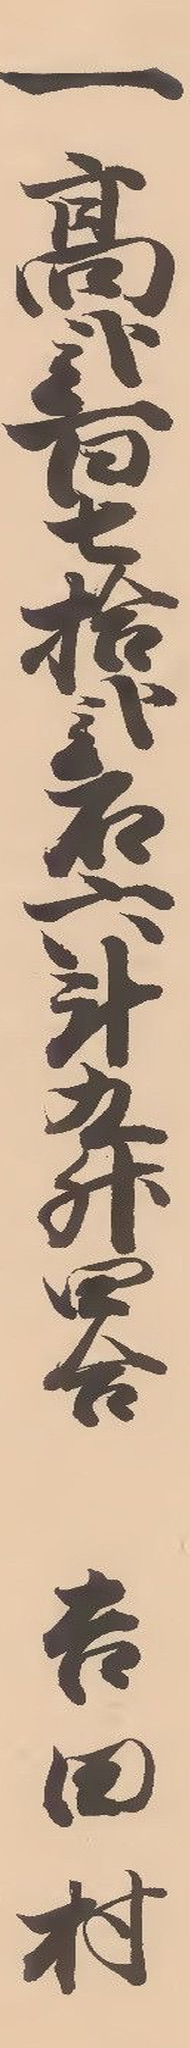一高弐百名七拾弐石六斗九升四合吉田村
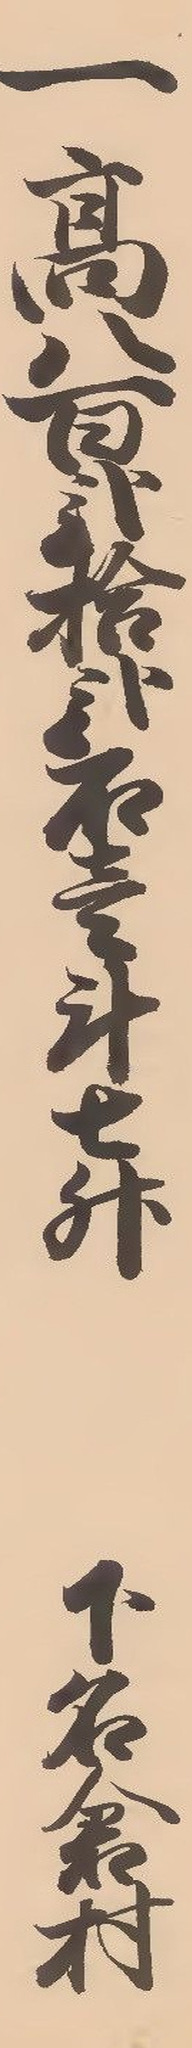一高八百弐拾弐石壱斗七升下名倉村
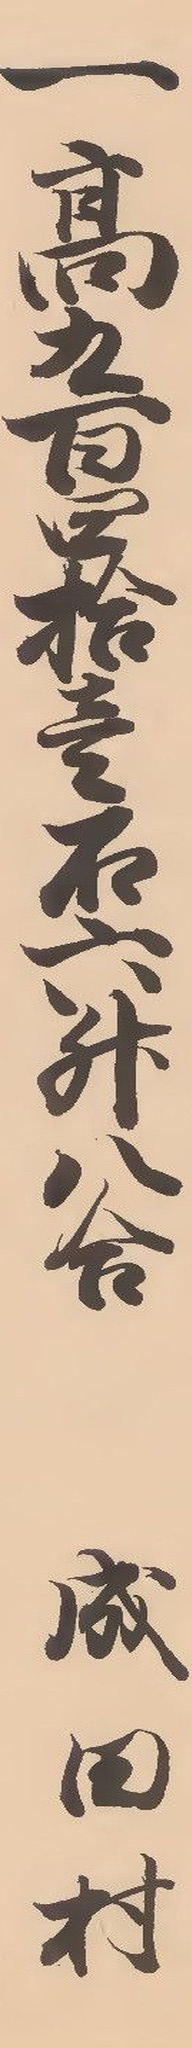一高九百四拾壱石六升八合成田村
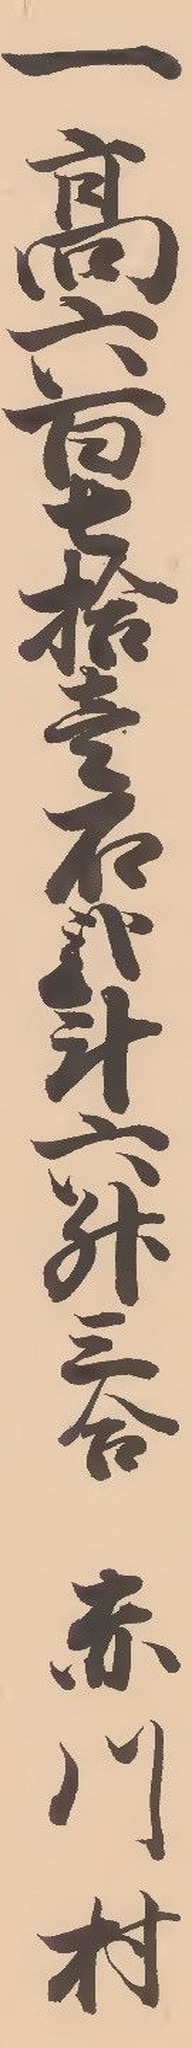一高六百七拾壱石弐斗六升三合赤川村
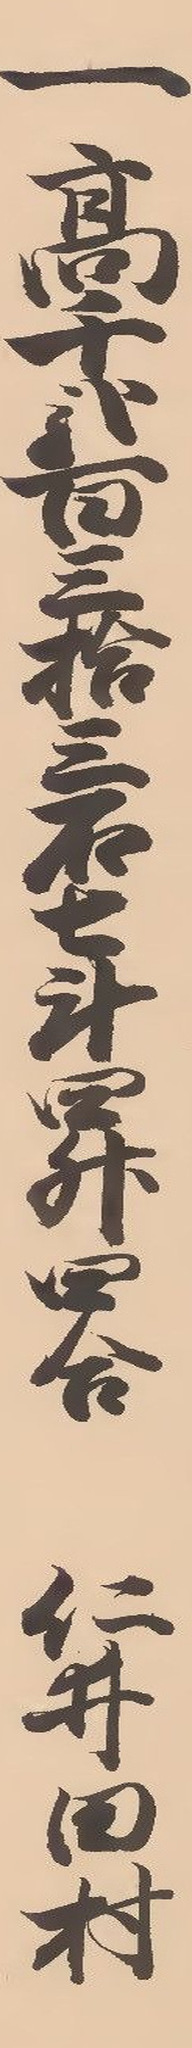一高千弐百三拾三石七斗四升四合仁井田村
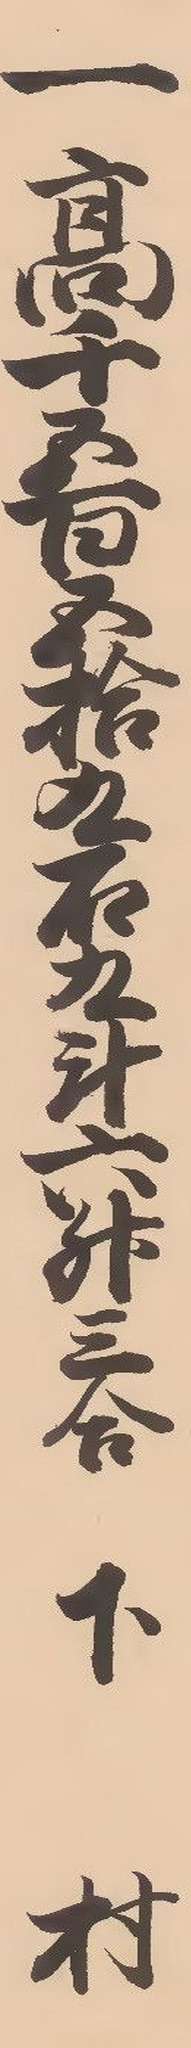一高千五百五拾九石九斗六升三合下村
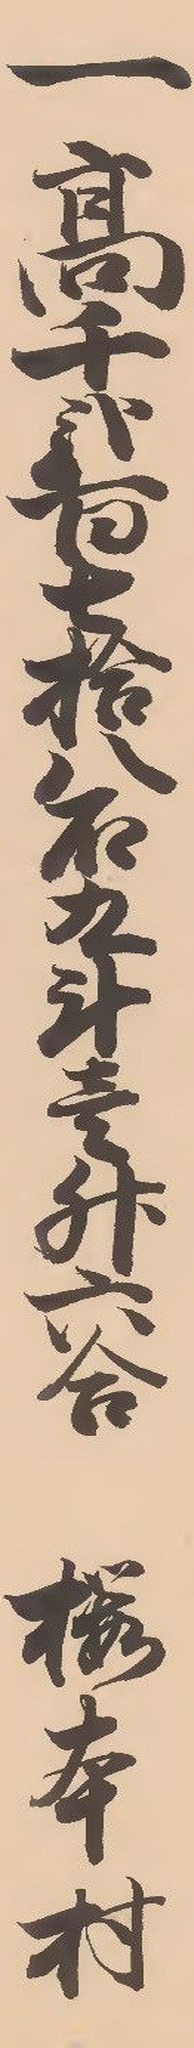一高千弐百七拾八石九斗壱升六合桜本村
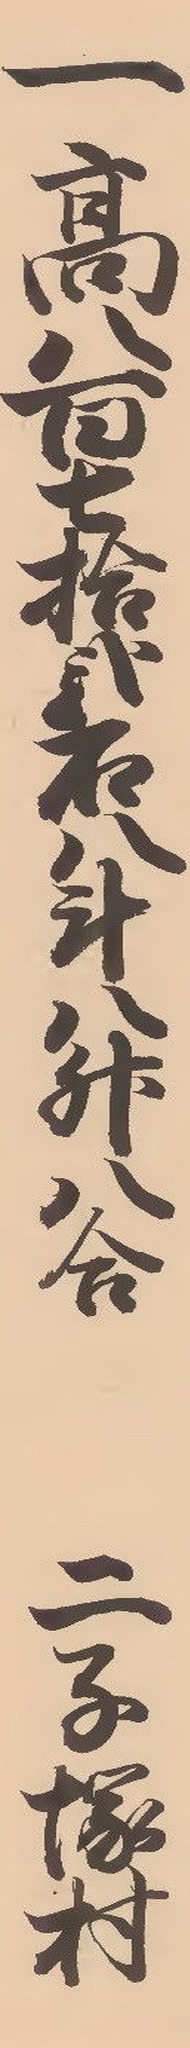一高八百七拾弐石八斗八升八合二子塚村

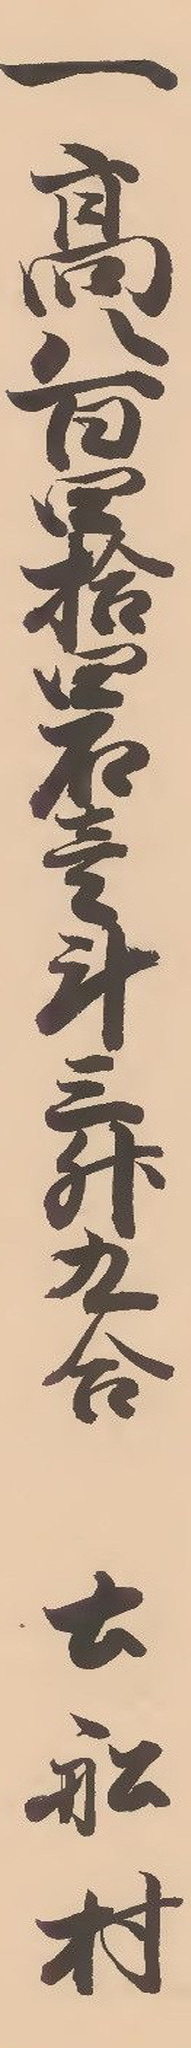一高八百四拾四石壱斗三升九合土船村
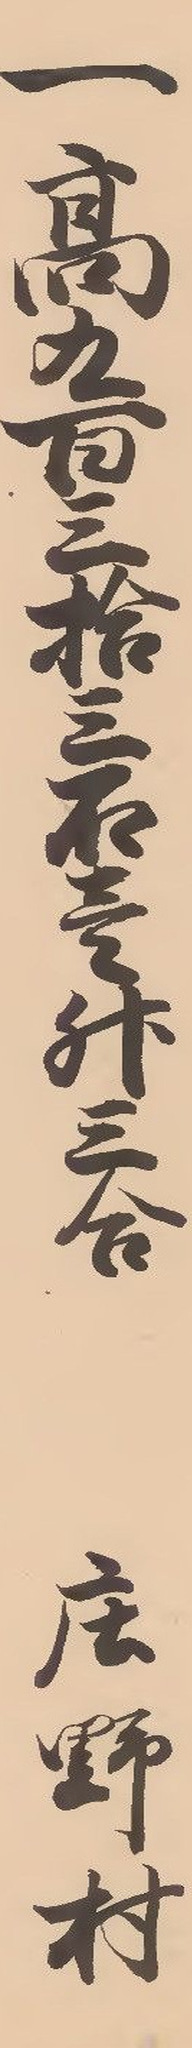一高九百三拾三石壱升三合庄野村
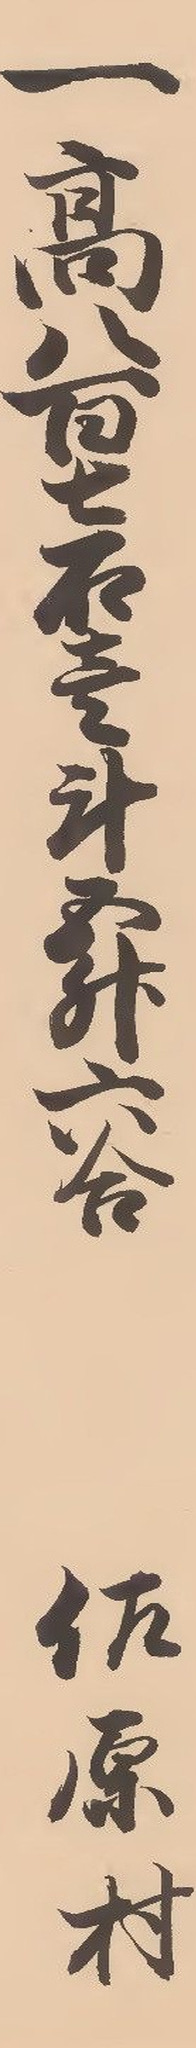一高八百七石壱斗五升六合佐原村
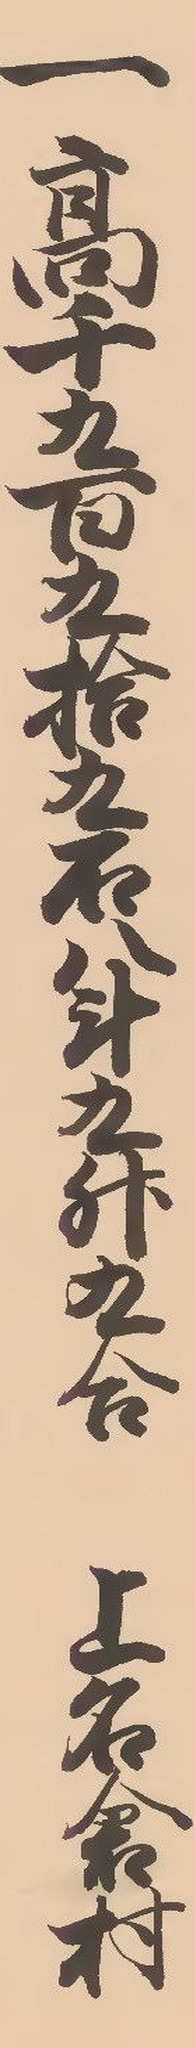一高千九百九拾九石八斗九升九合上名倉村
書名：陸奥国郷帳　４
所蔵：国立公文書館 National Archives of Japan
